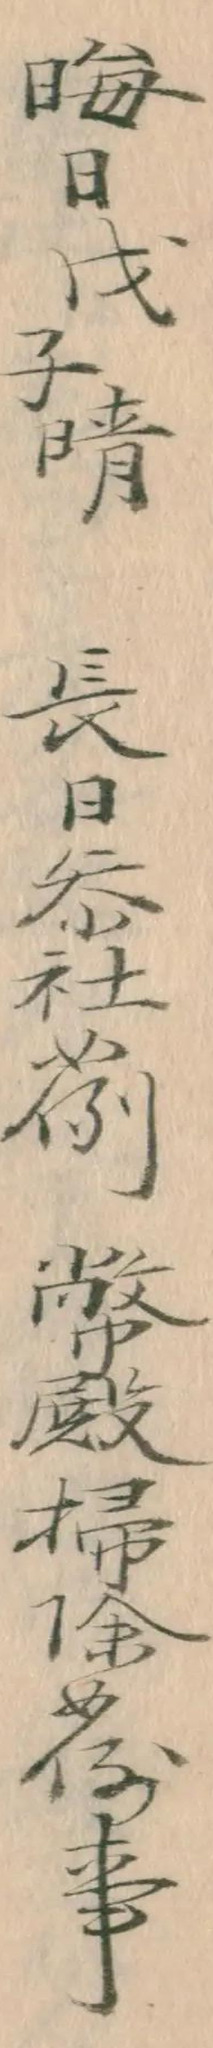晦日戊子晴長日参社如例幣殿掃除如例事
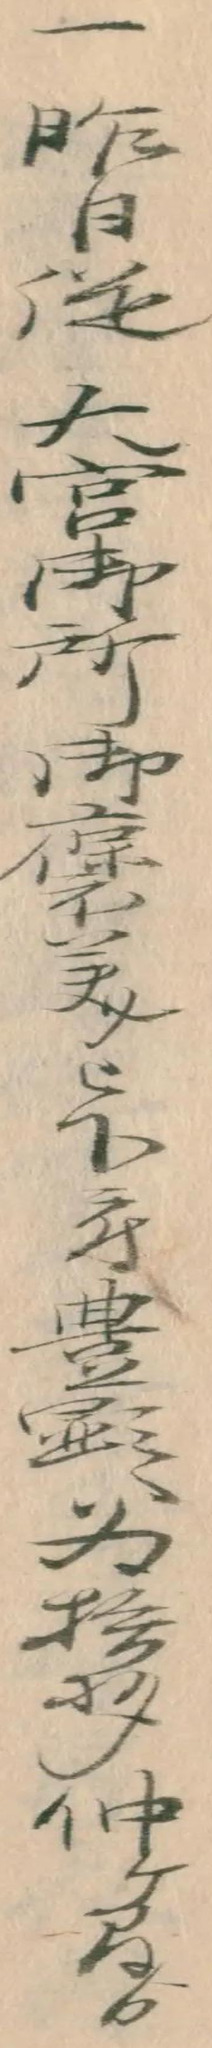一昨日従大宮御所御褒美被下ニ付豊顕へ為挨拶仲ケ間ゟ
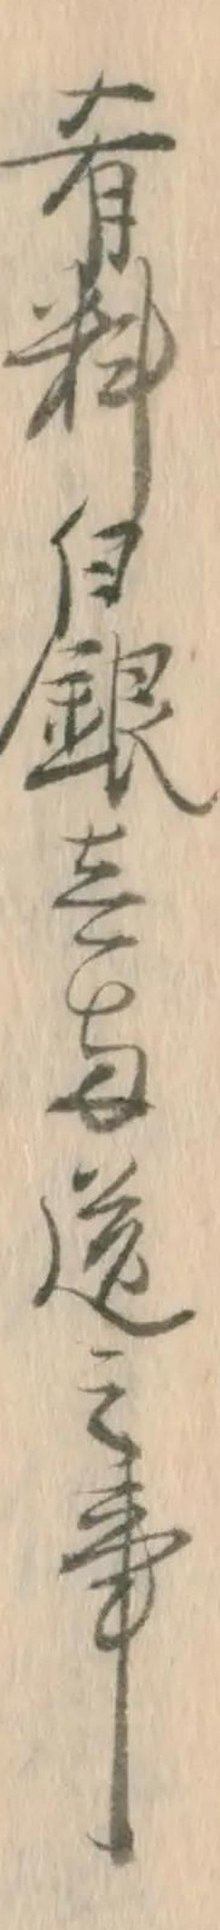肴料白銀壱両送之事
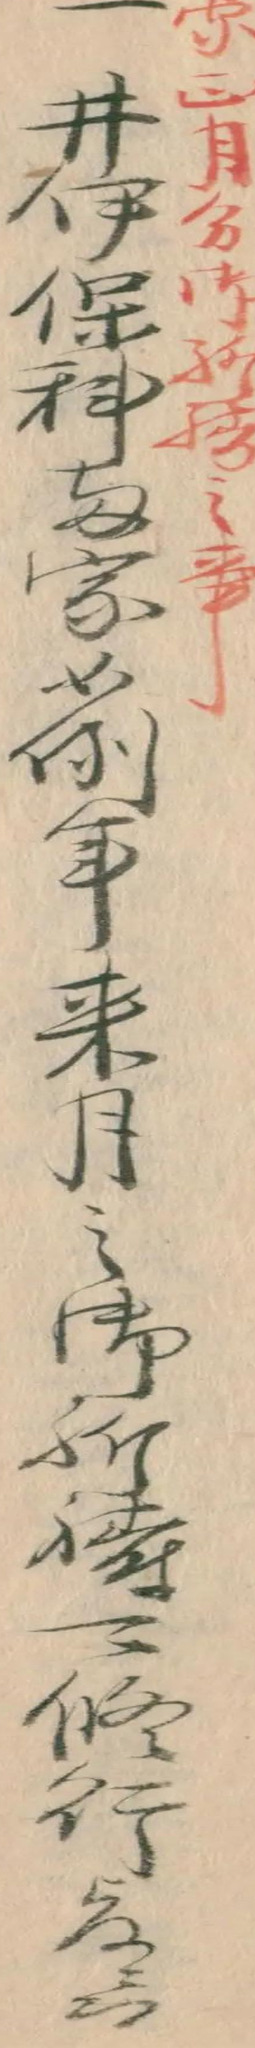井伊保科両家如例年来月之御祈祷可修行旨ニ而
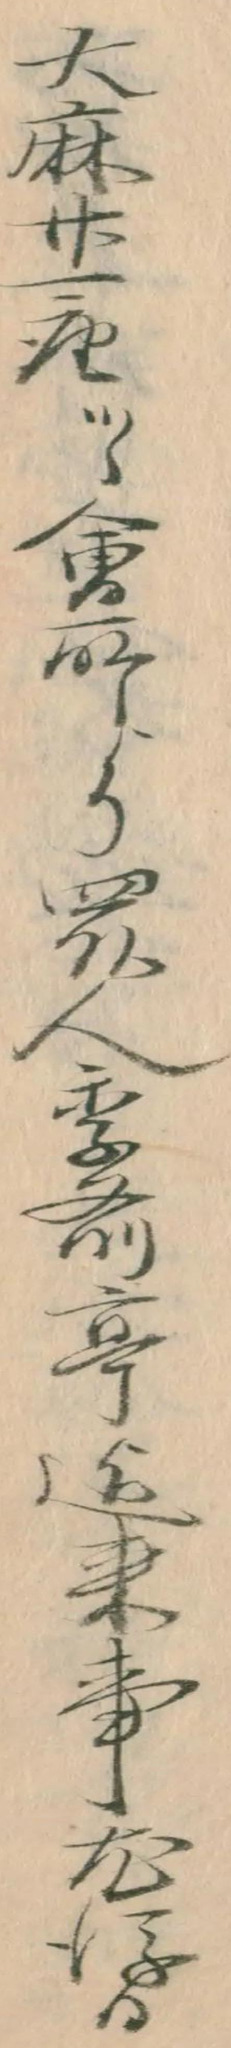大麻廿一座ツヽ會所より四頭人季前亭迄来事尤後日

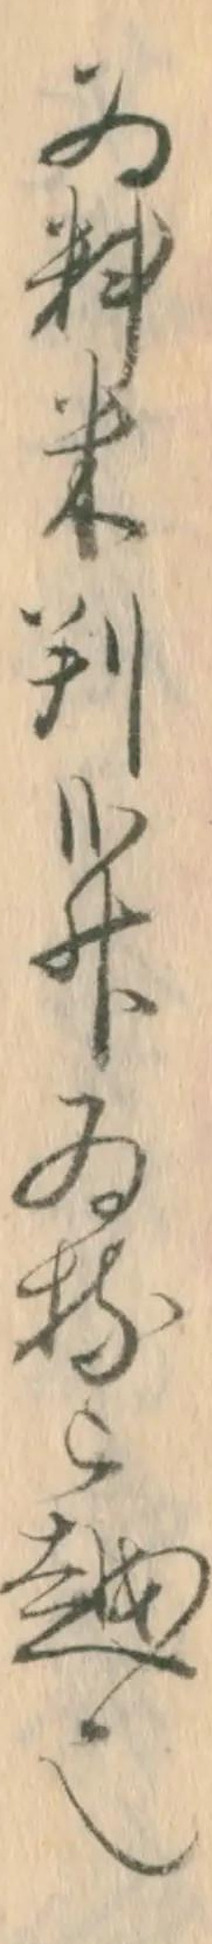為料米判弐升為持被越也
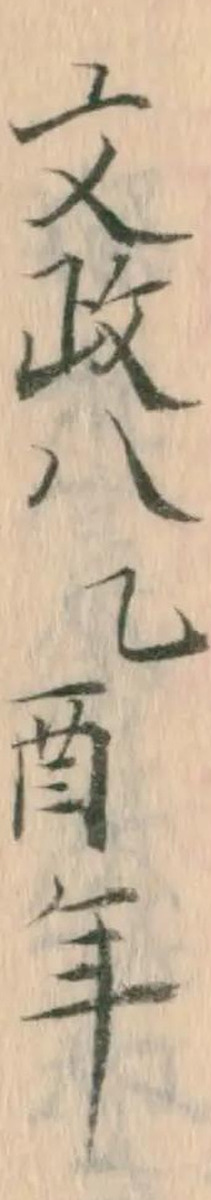文政八乙酉年
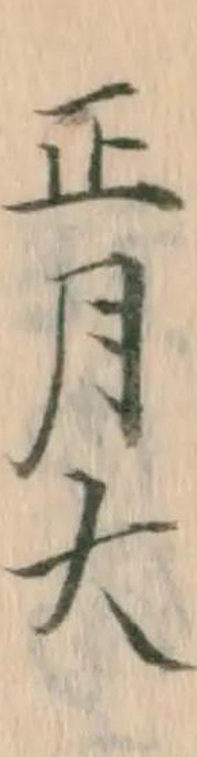正月大
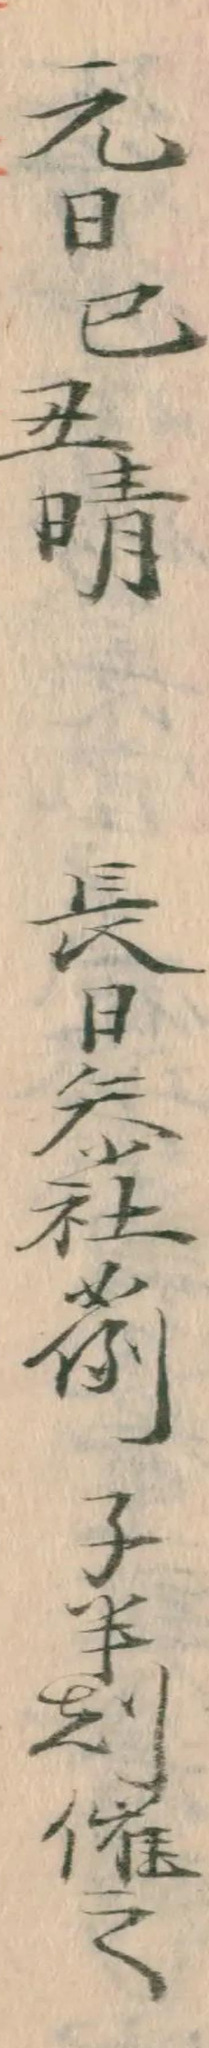元日己丑晴長日参社如例子半刻催之
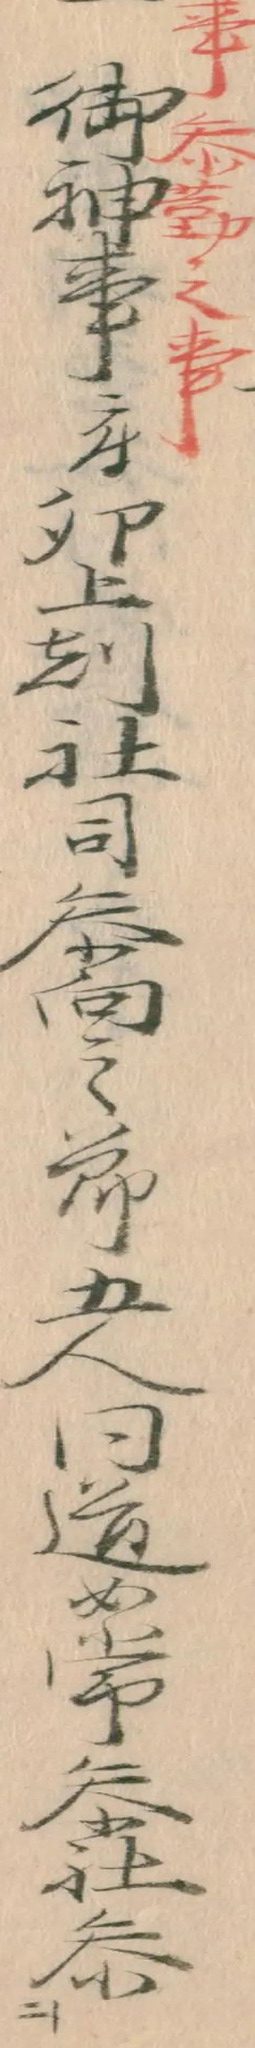一御神事ニ付卯上刻社司参向之節五人同道如常参社参
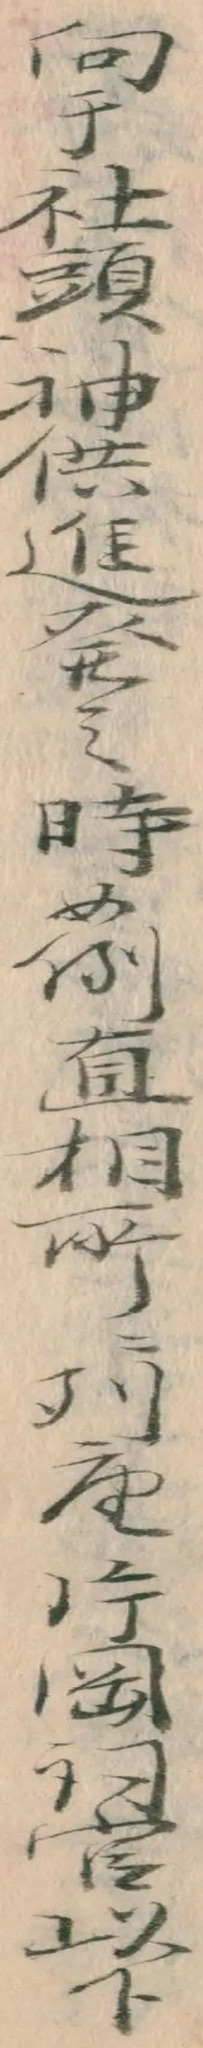向于社頭神供進発之時如例直相所に列座片岡祠官以下
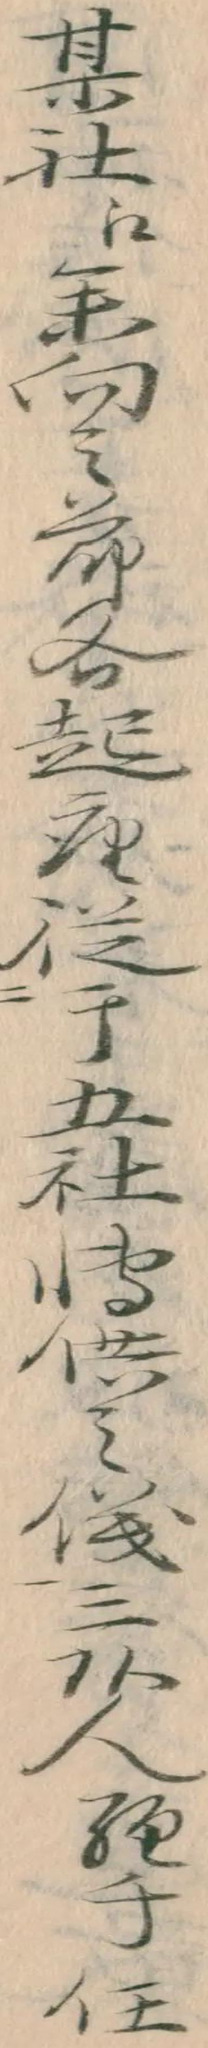某社え参向之節各起座従于五社轉供之儀三頭人経千任
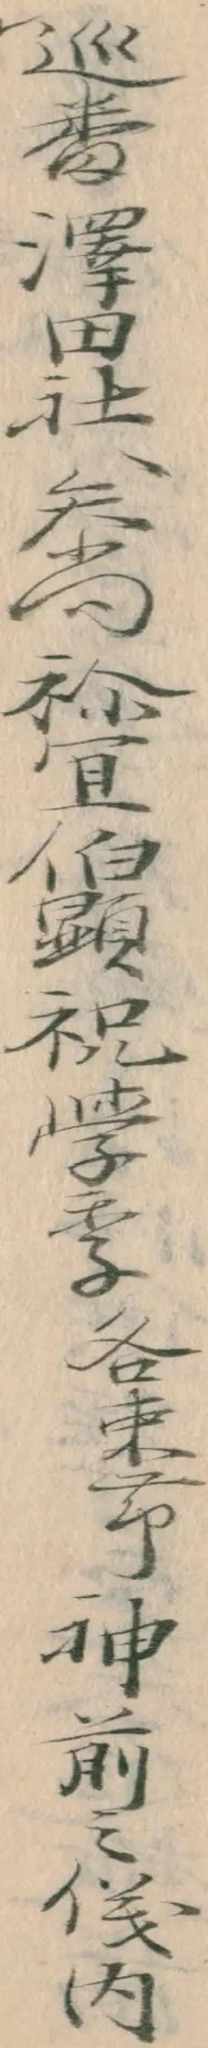巡番澤田社へ参向祢宜伯顕祝学季各束帯神前之儀内
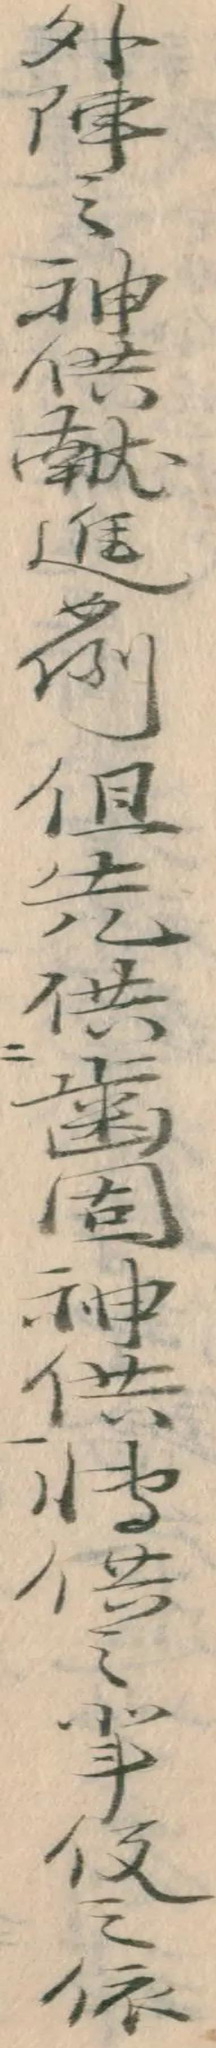外陣之神供献進如例但先供歯固神供轉供之輩役之依

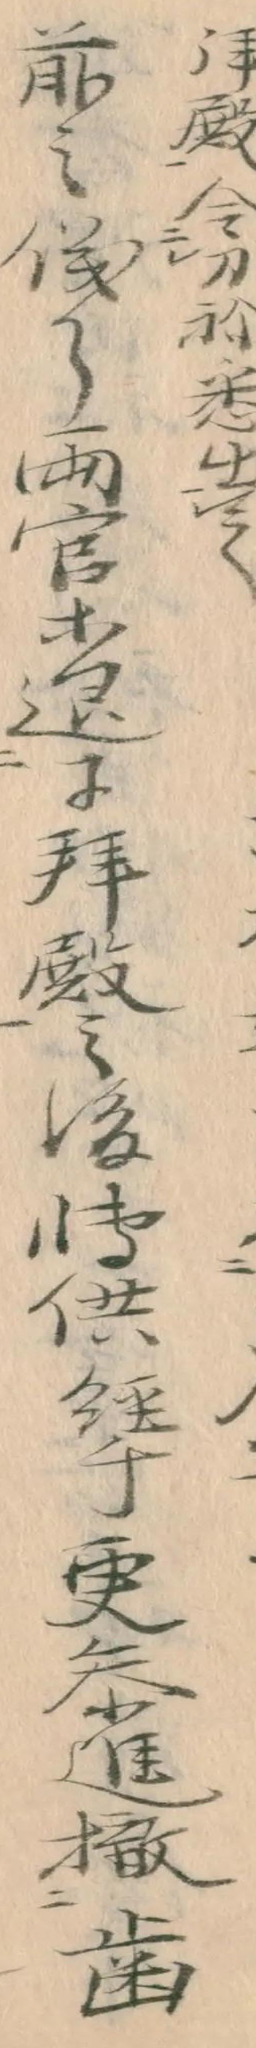前之儀了両官等退于拝殿之後轉供経千更参進撒歯
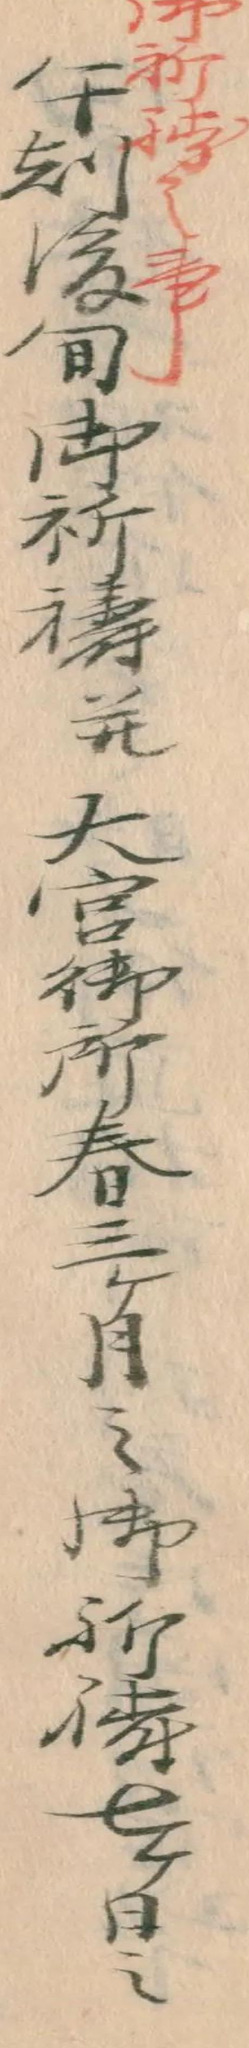一午刻後旬御祈祷并大宮御所春三ケ月之御祈禱七ケ日之
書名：賀茂社記録. 第74冊
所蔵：国立国会図書館 National Diet Library, JAPAN
